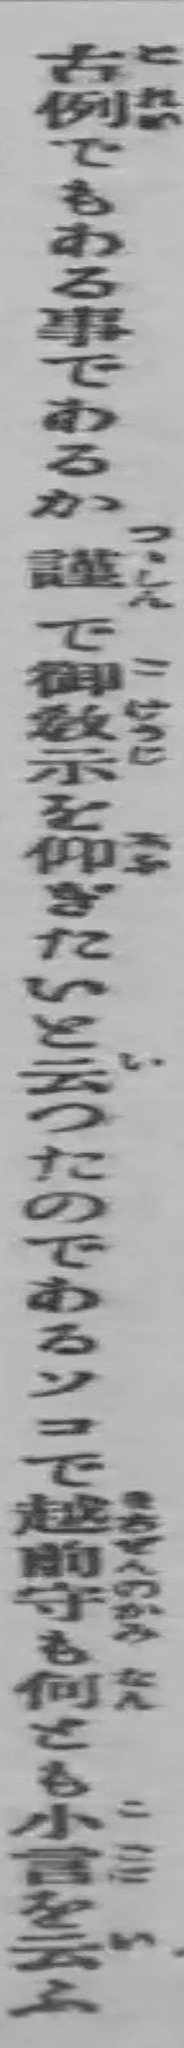古例でもある事であるか謹で御教示を仰ぎたいと云つたのであるソコで越前守も何とも小言を云ふ
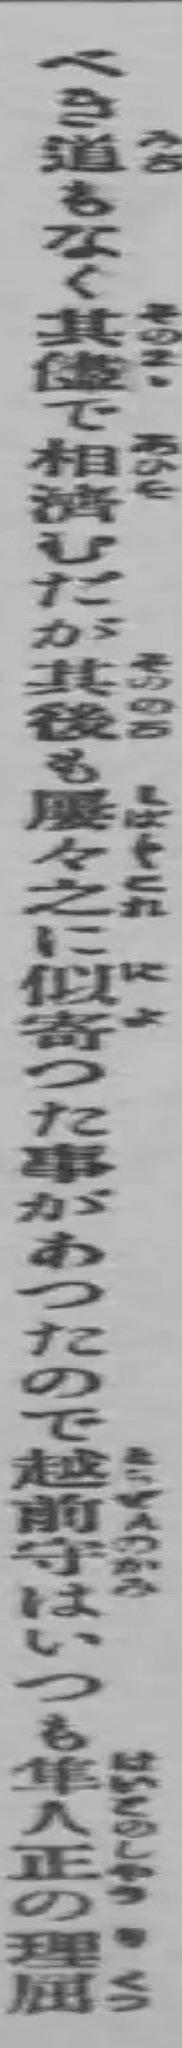べき道もなく其侭で相済むだが其後も屡々之に似寄つた事があつたので越前守はいつも隼人正の理屈
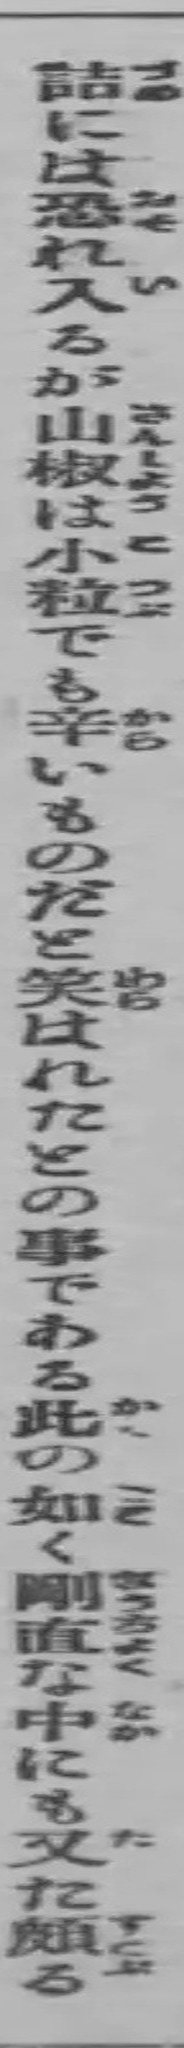詰には恐れ入るが山椒は小粒でも辛いものだと笑はれたとの事である此の如く剛直な中にも又た頗る
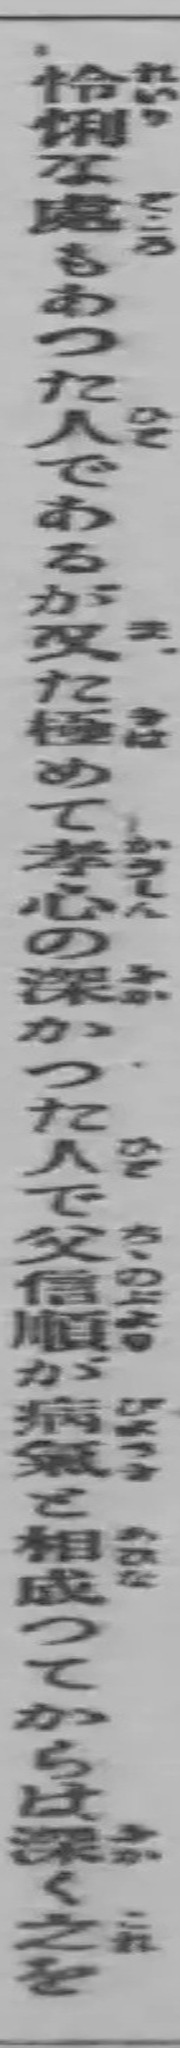怜悧な処もあつた人であるが又た極めて孝心の深かつた人で父信順が病気と相成つてからは深く之を
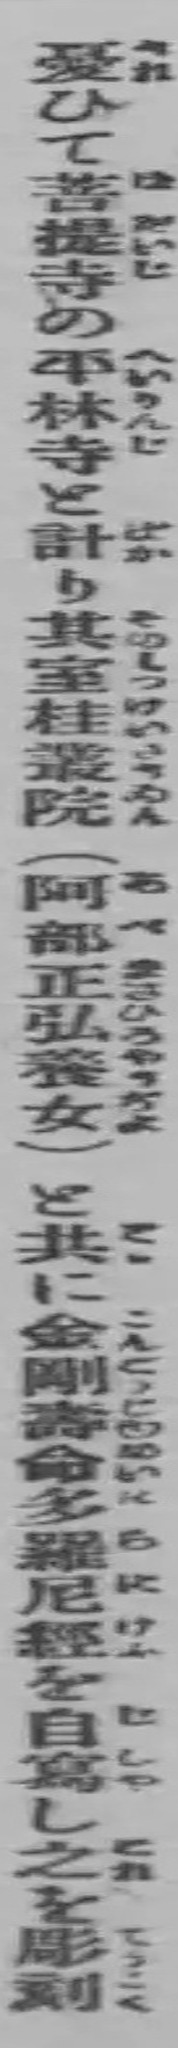憂ひて菩提寺の平林寺と計り其室桂叢院(阿部正弘養女)と共に金剛寿命多羅尼経を自写し之を彫刻
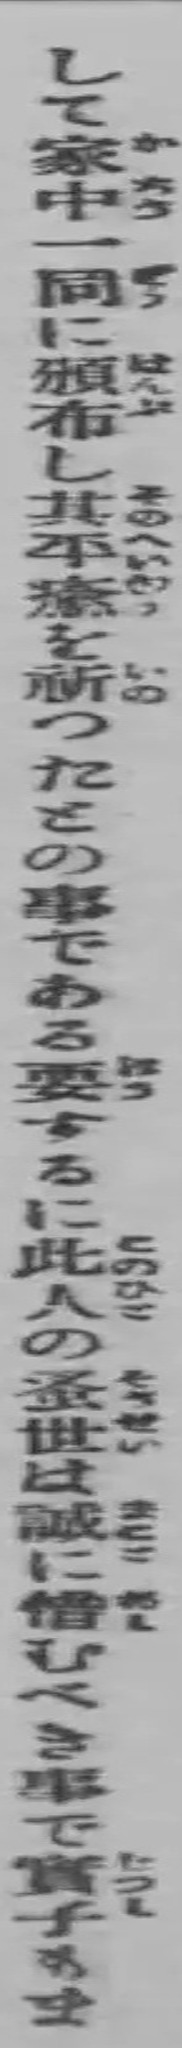して家中一同に頒布し其平癒を祈つたとの事である要するに此人の蚤世は誠に惜むべき事で実子もま
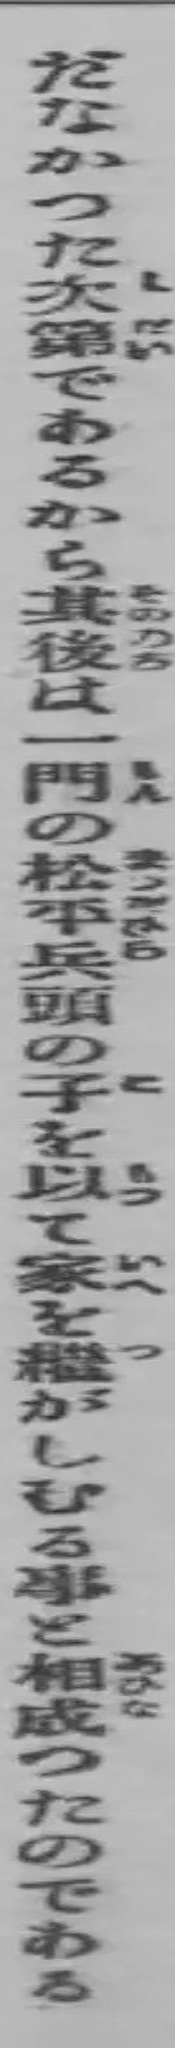だなかつた次第であるから其後は一門の松平兵頭の子を以て家を継がしむる事と相成つたのである
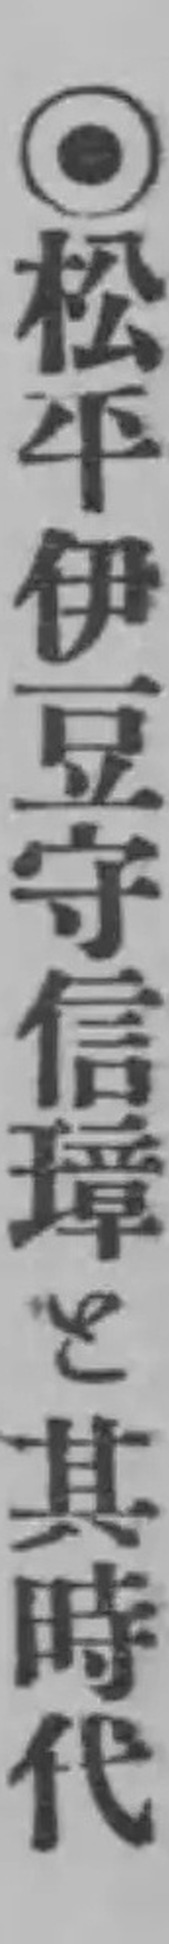⦿松平伊豆守信璋と其時代
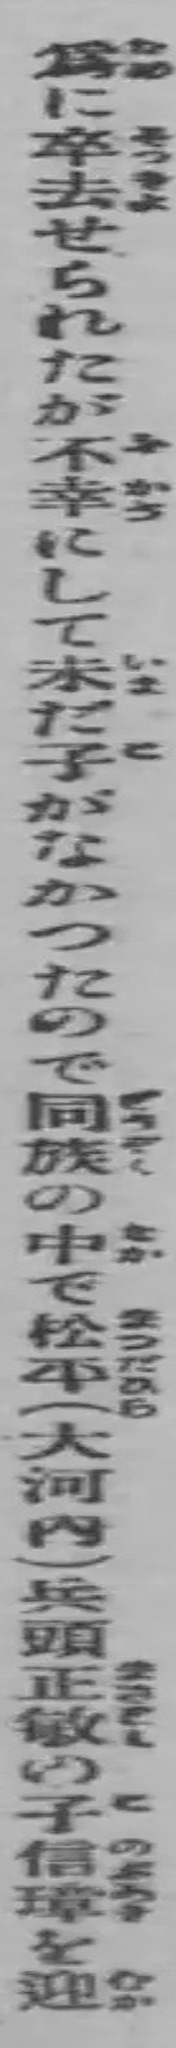為に卒去せられたが不幸にして未だ子がなかつたので同族の中で松平(大河内)兵頭正敏の子信璋を迎
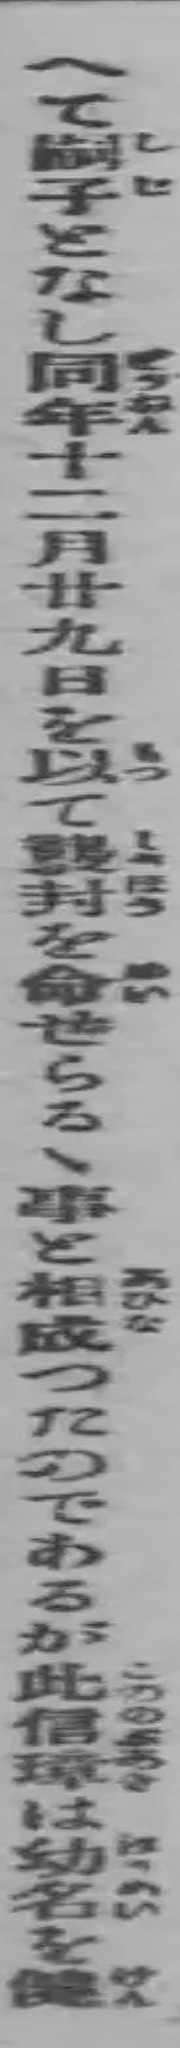へて嗣子となし同年十二月廿九日を以て襲封を命ぜらるゝ事と相成つたのであるが此信璋は幼名を健
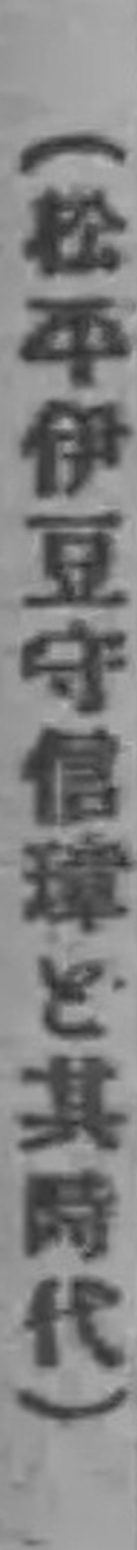⦿松平伊豆守信璋と其時代

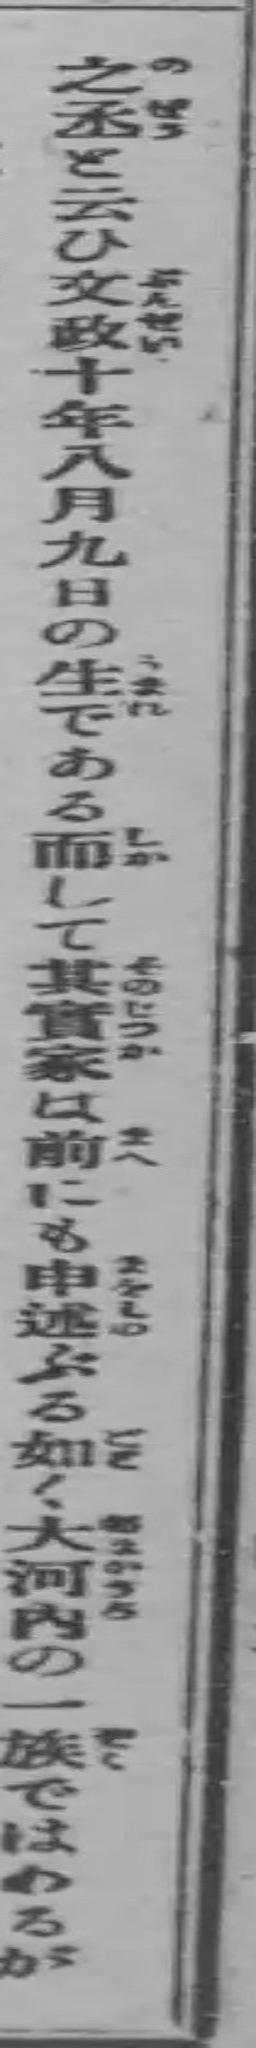之丞と云ひ文政十年八月九日の生である而して其実家は前にも申述ぶる如く大河内の一族ではあるが
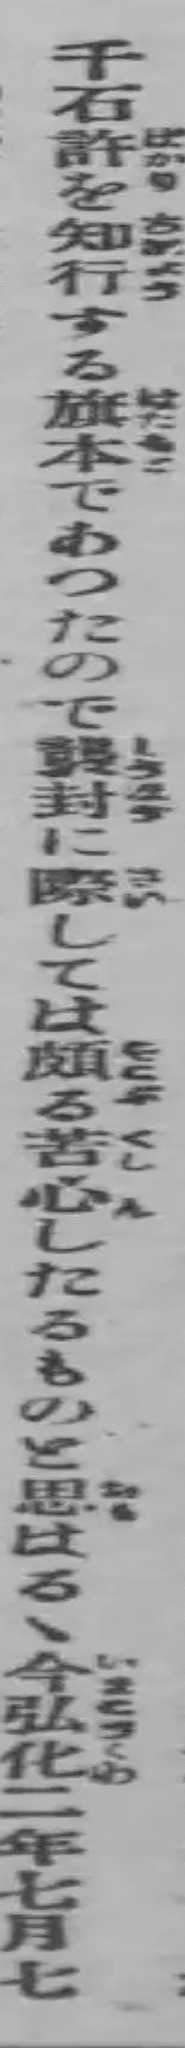千石許を知行する旗本であつたので襲封に際しては頗る苦心したるものと思はるゝ今弘化二年七月七
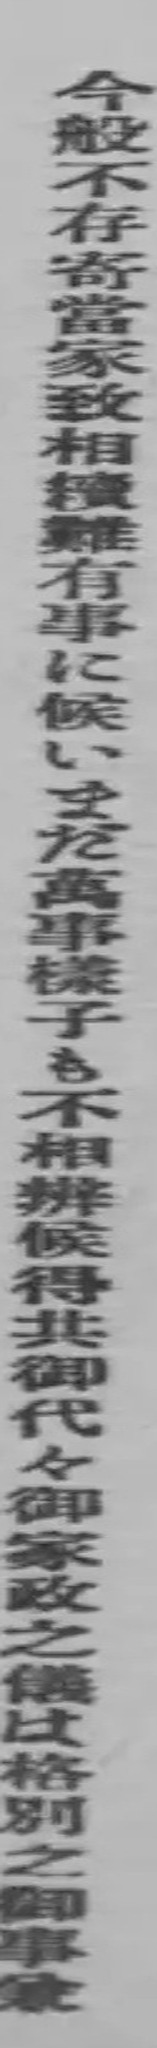今般不存寄当家致相続難有事に候いまだ万事様子も不相弁候得共御代々御家政之儀は格別之御事兼
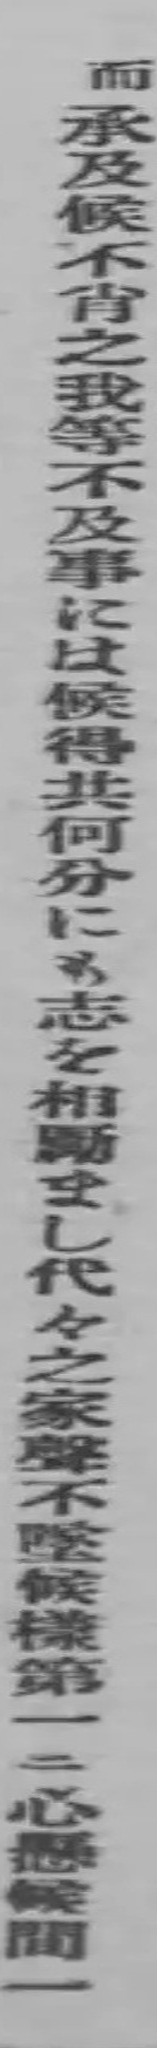而承及候不肖之我等不及事には候得共何分にも志を相励まし代々之家声不墜候様第一ニ心懸候間一
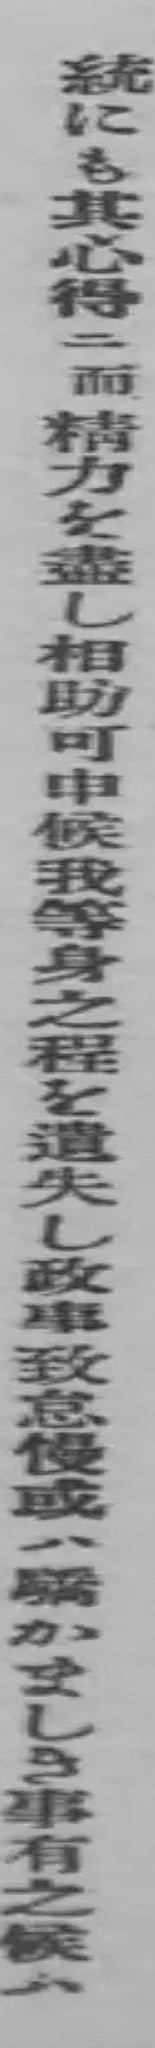統にも其心得ニ而精力を尽し相助可申候我等身之程を遺失し政事致怠慢或ハ驕かましき事有之候ハ
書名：豊橋市史談
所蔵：国立国会図書館 National Diet Library, JAPAN
